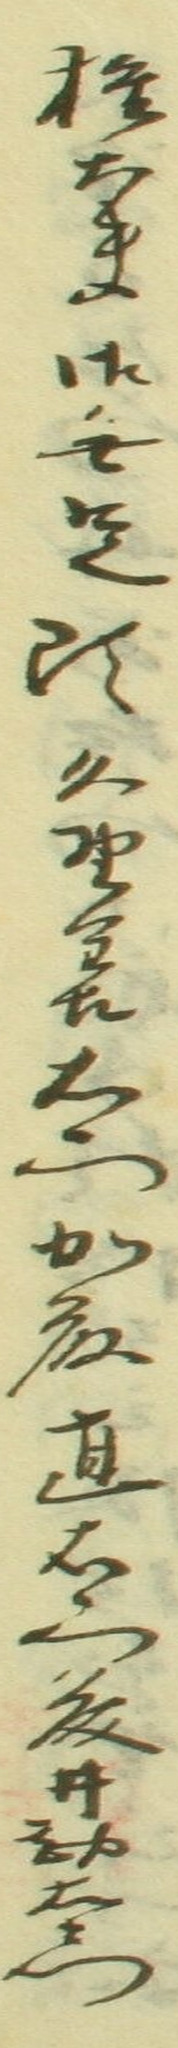権太夫御無足頭久野善右衛門加藤直右衛門藤井勘右エ門

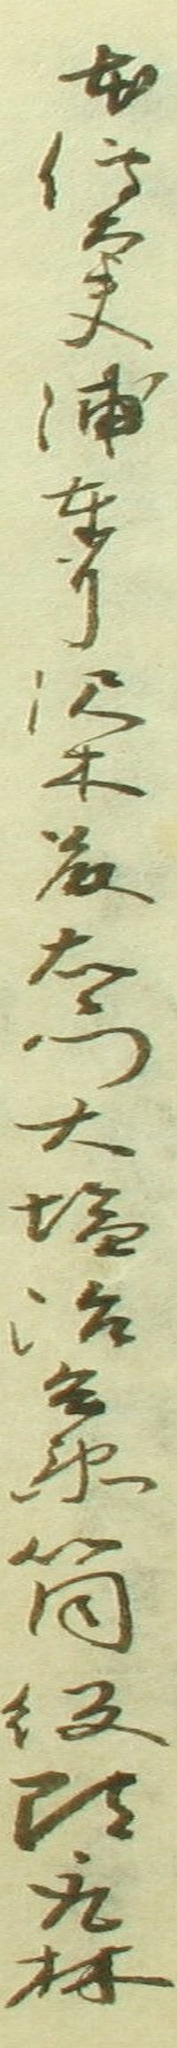本傳太夫浦奉行沢木藤右衛門大塩治兵衛筒役頭取林
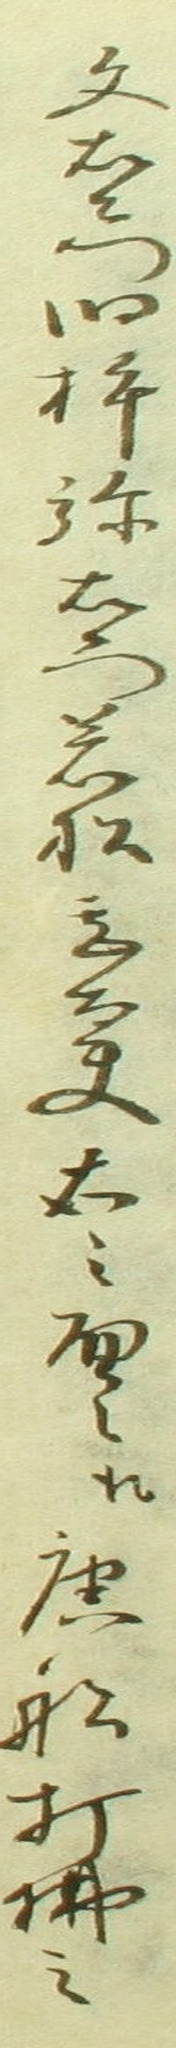文右衛門臼杵弥右衛門若松甚太夫右之面々江唐船打払之
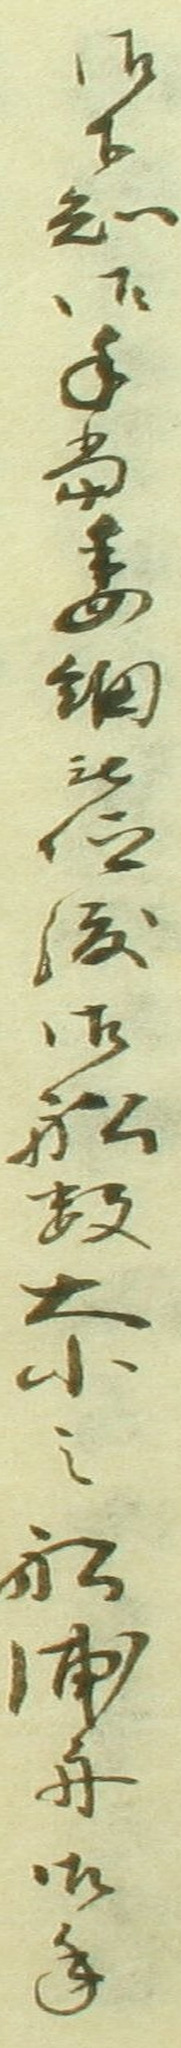御下知御手当委細被仰渡御船数大小之船浦舟御手
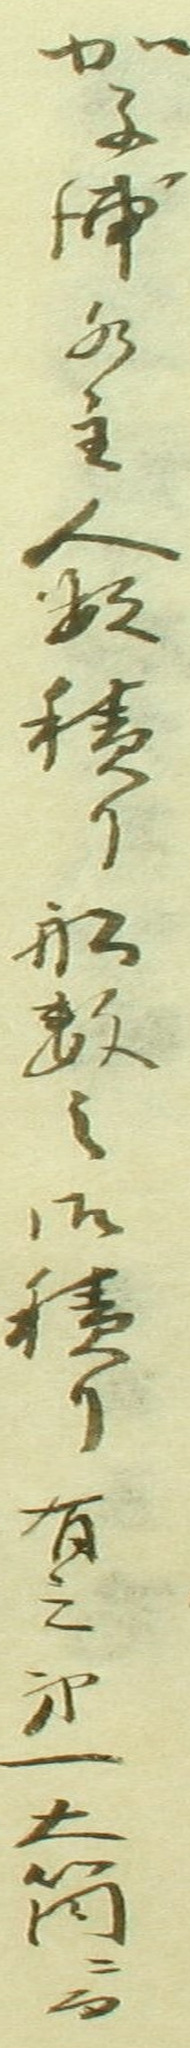加子浦水主人数積り船数之御積り有之第一大筒ニ而
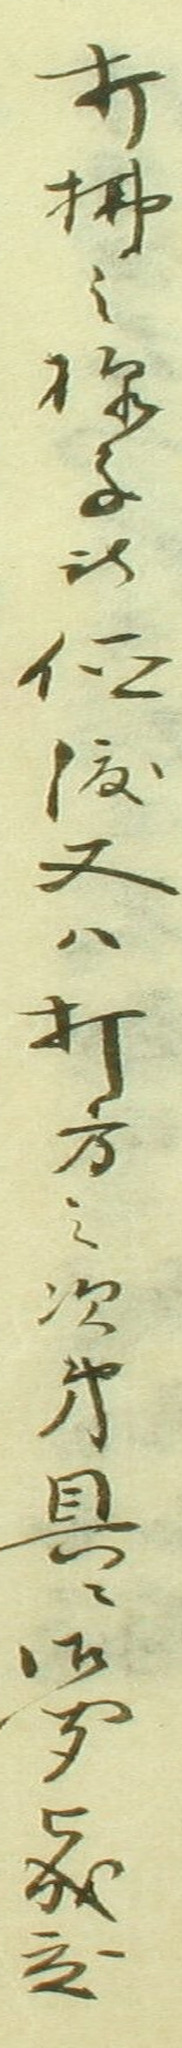打払之様子被仰渡又は打方之次第具に御聞被成度
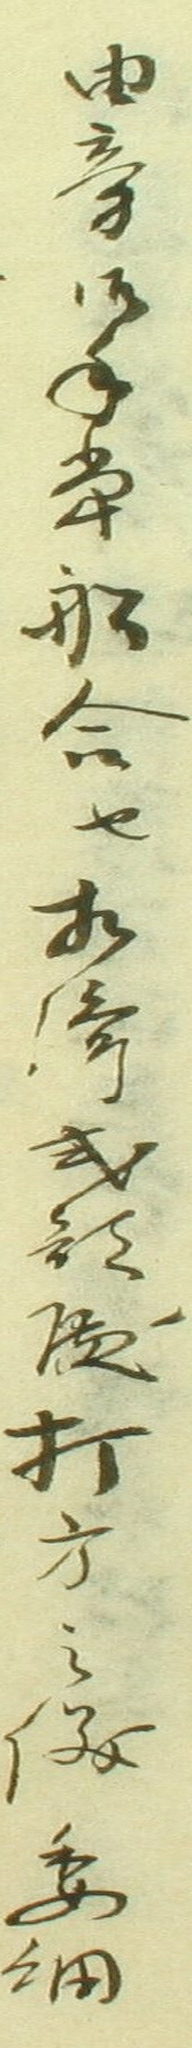由旁御手当船合せ相済式部殿打方之儀委細
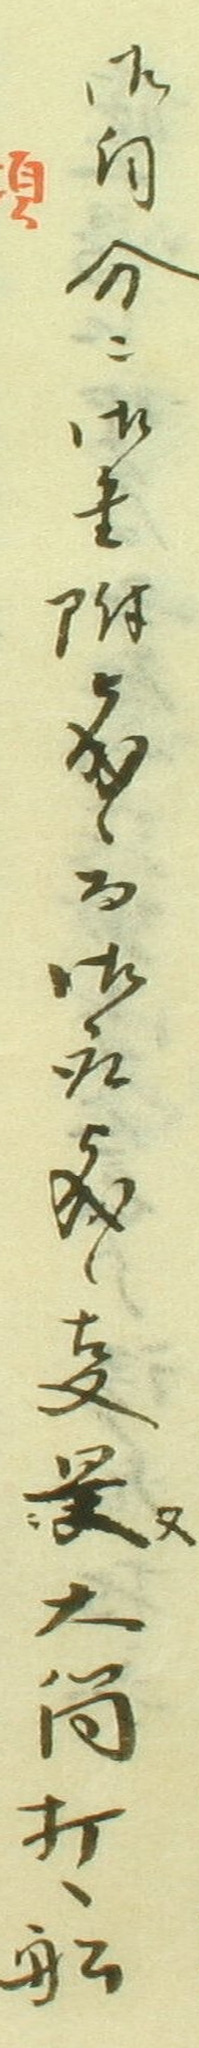御自分ニ御書附被成候而御取被成候叓是又大筒打へ船
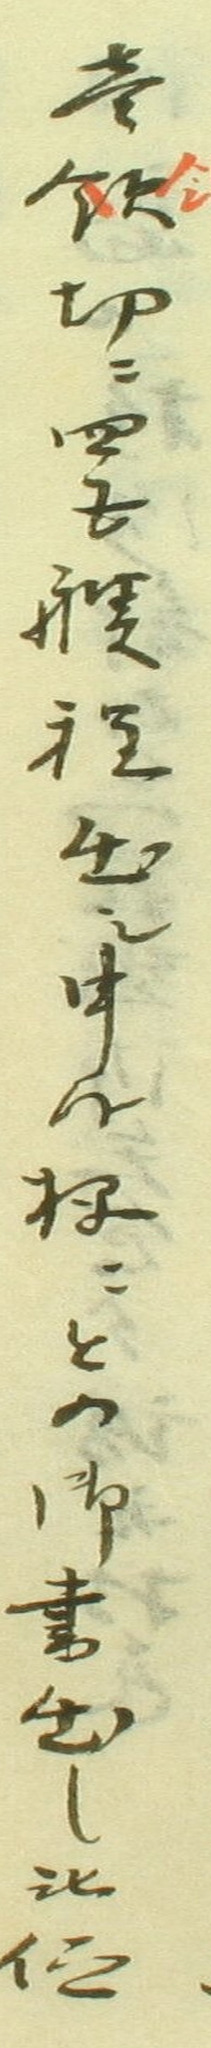壱領切に四五艘程出シ申候様にとの御書出し被仰
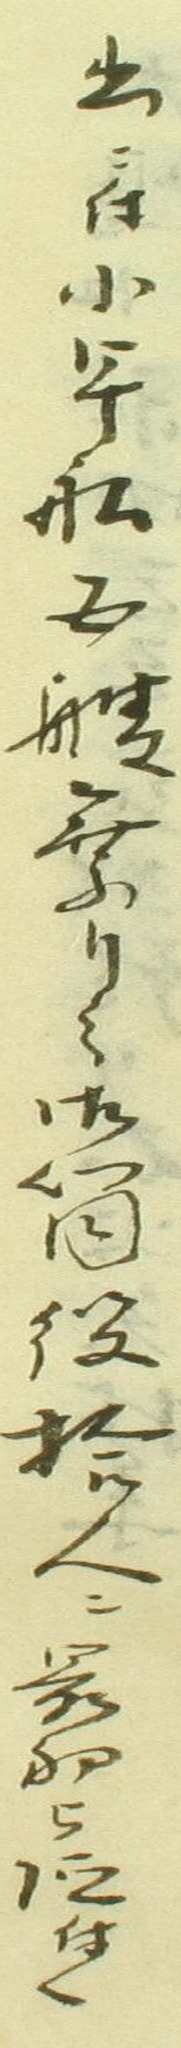出ニ付小早船五艘乗り之御筒役拾人ニ最初被仰付く
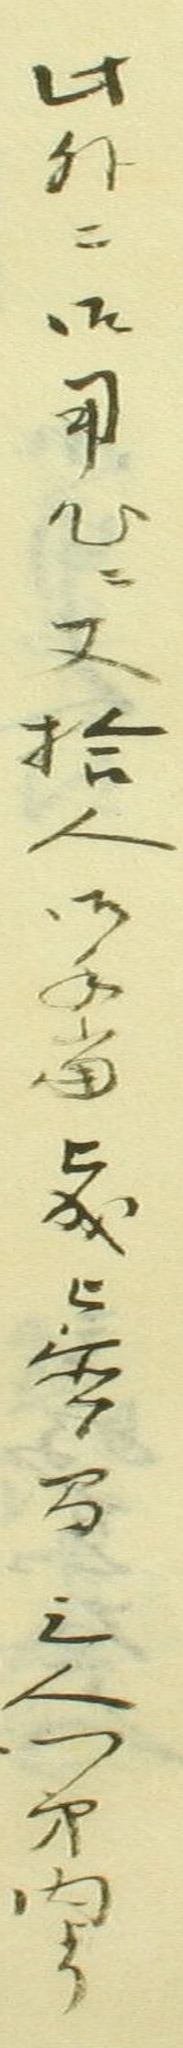此外ニ御用心ニ又拾人御手当被成被忝候間三人門弟内より
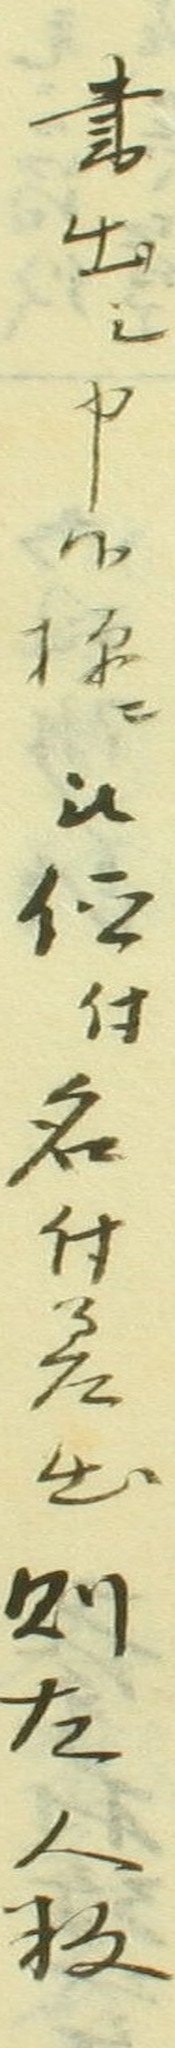書出し申候様ニ被仰付名付差出則左人数
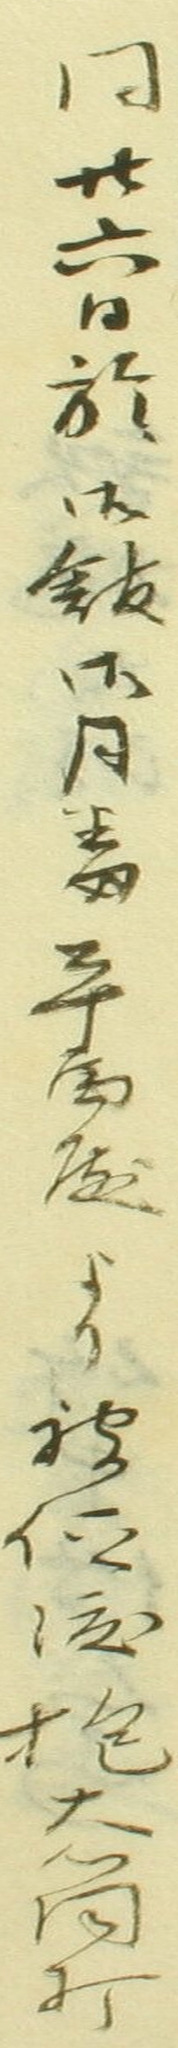一同廿六日於御館御月番平馬殿より被仰渡抱大筒打
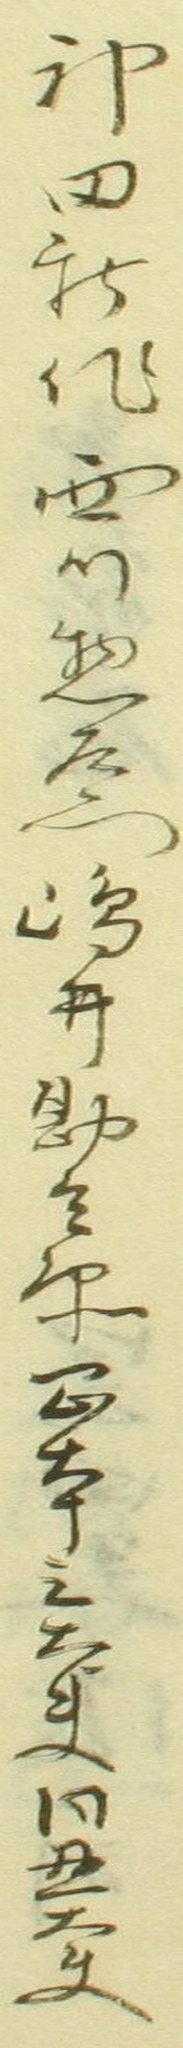神田新作西川惣左衛門嶋井勘兵衛岡本三太夫同丑太夫
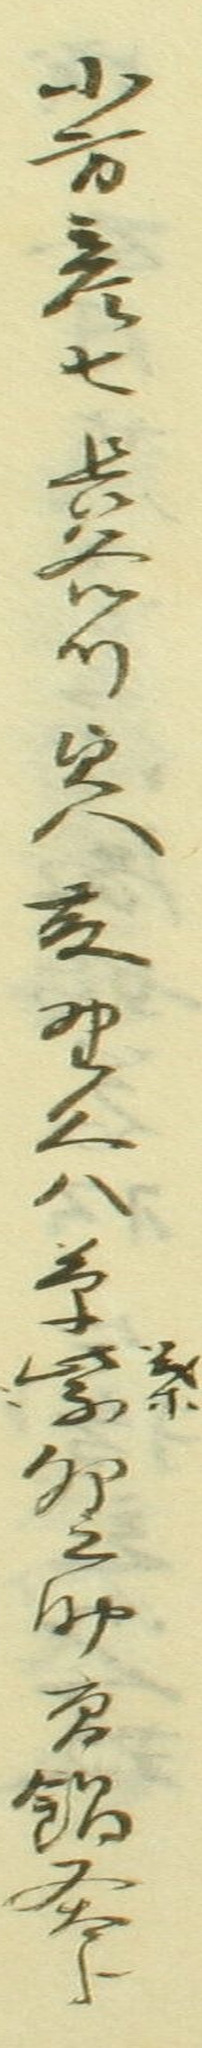小方彦七長谷川貞八藤野久八草葉卯之介高鍋又太郎
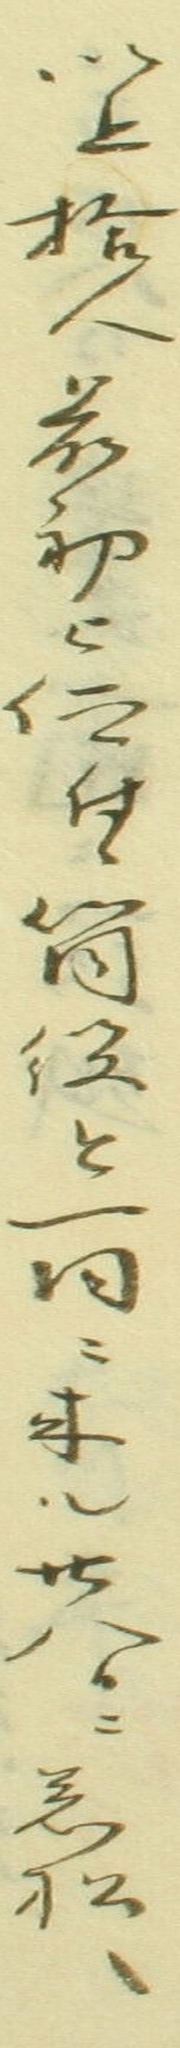以上拾人最初被仰付候筒役と一同ニ来ル廿八日ニ若松へ
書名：唐船漂流記 二
